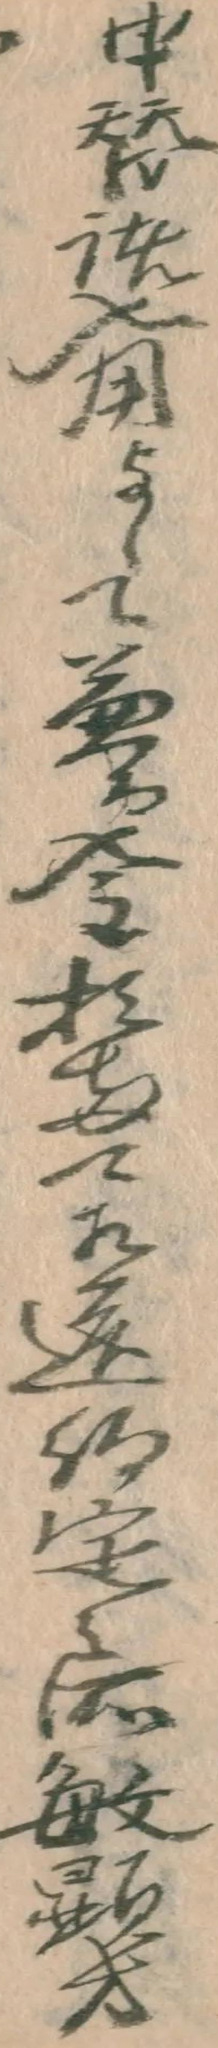申替諸入用として兼而金拾両可相送約定之所敏顕方
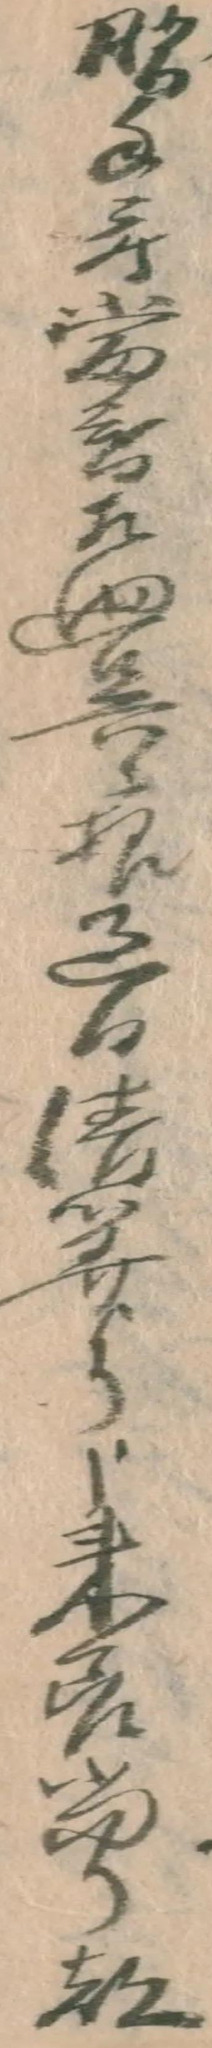勝手ニ付當暮相廻呉候様過日清算より申来差當り都
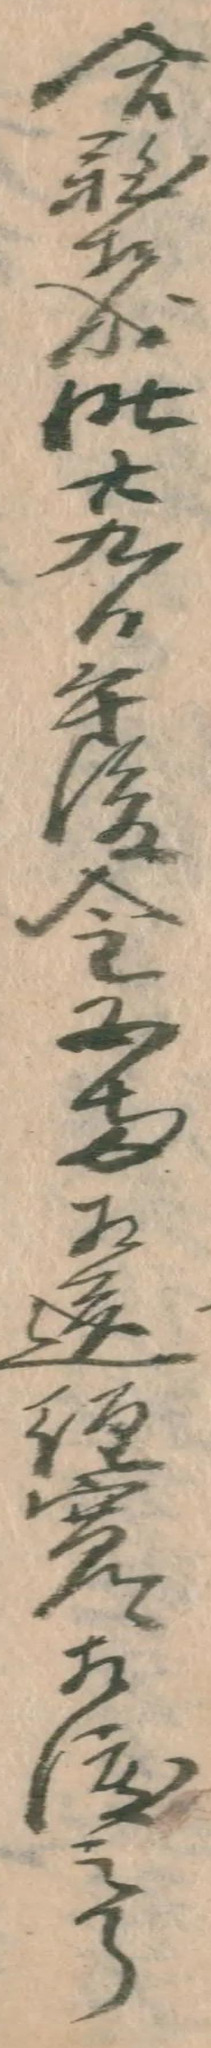合難相成昨廿九日午後金五両相送経寛へ相渡之了
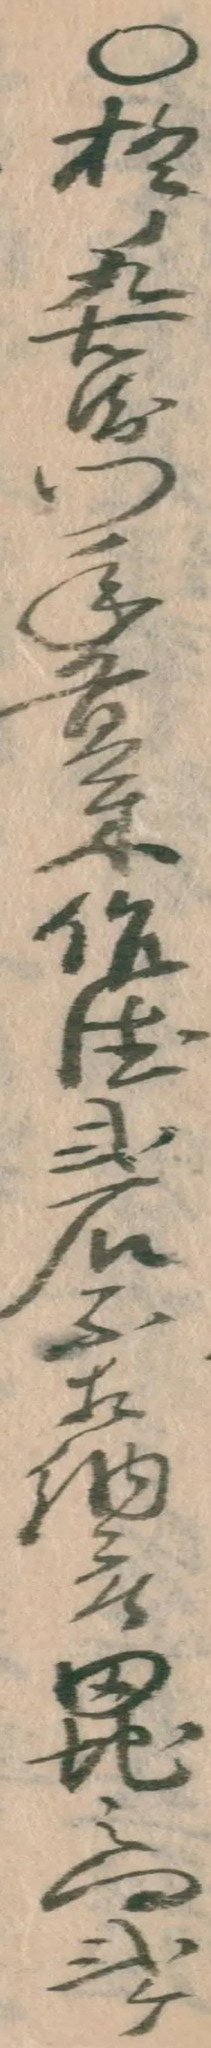○柊ノ九右衛門年貢米作徳弐石不相納ニ付田地之向弐ヶ
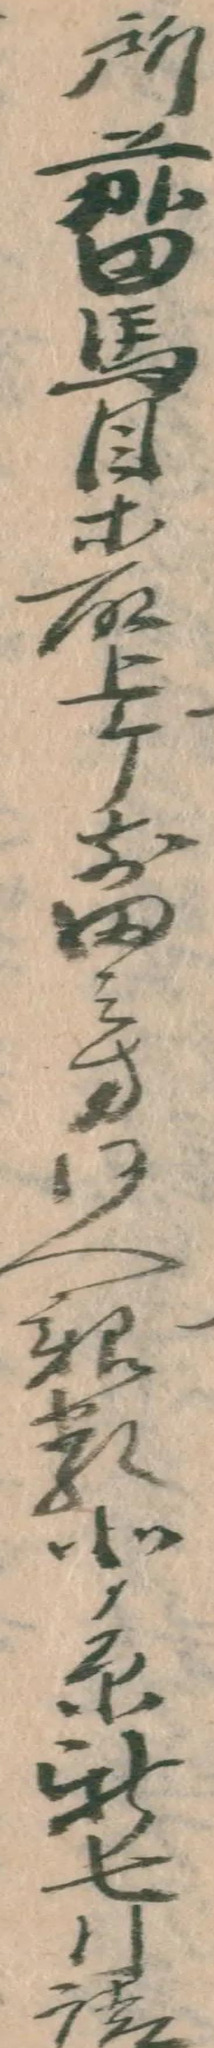所前田馬目等取上ヶ前田之方同人親類北ノ原新七引請
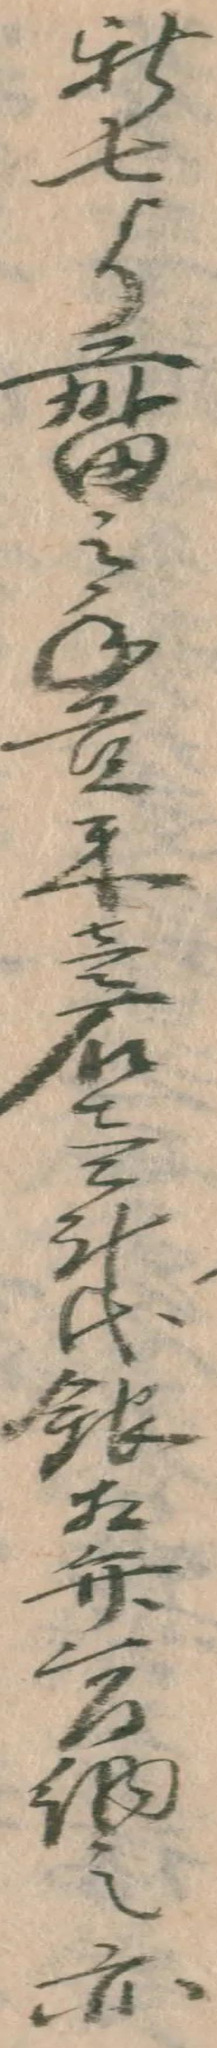新七より前田之年貢米壱石壱斗代銀相弁今日納之亦
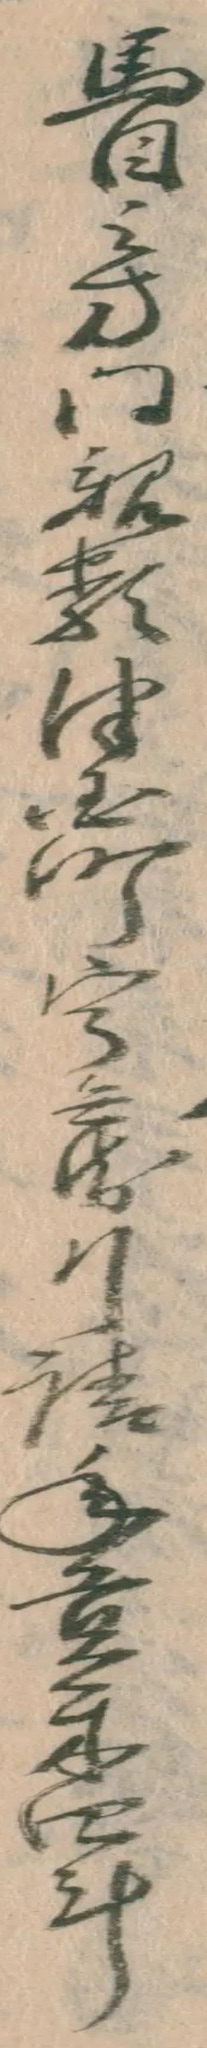馬目之方同親類津国町宇兵衛引請年貢米四斗
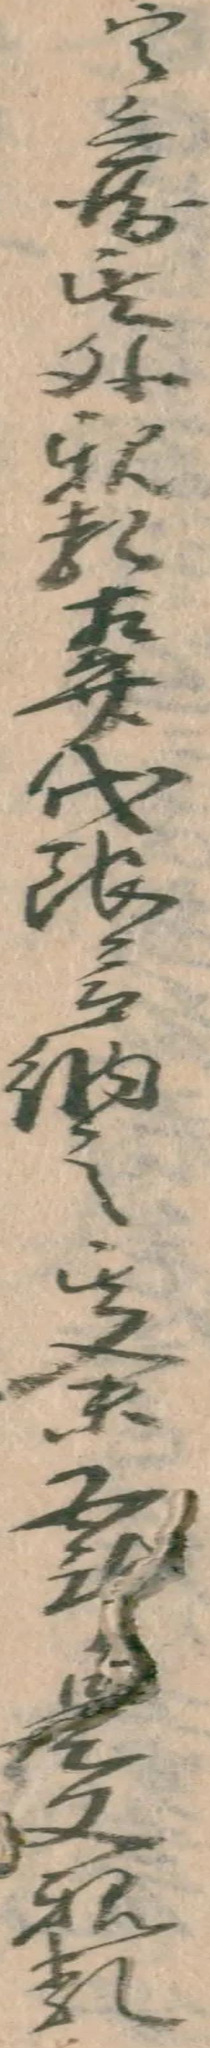宇兵衛其外親類相弁代銀二而納之其余五郎又親類
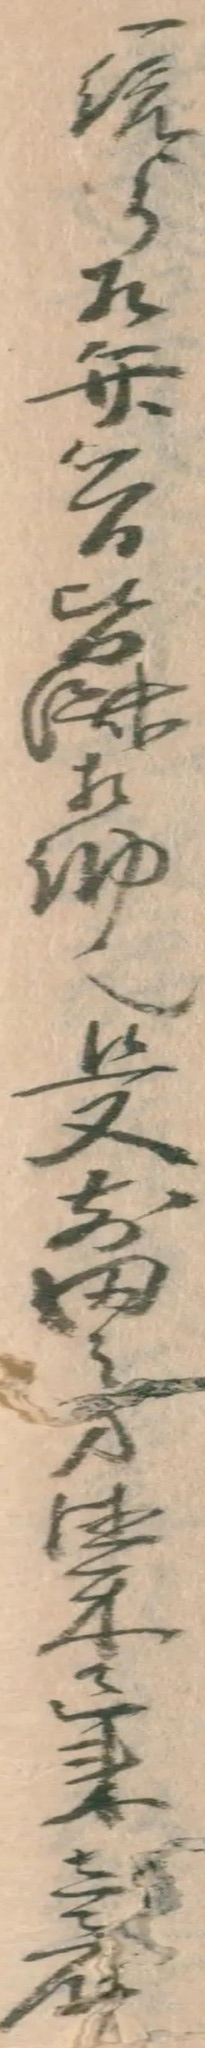一統より相弁今日皆済相納也且又前田之方植米已来壱石
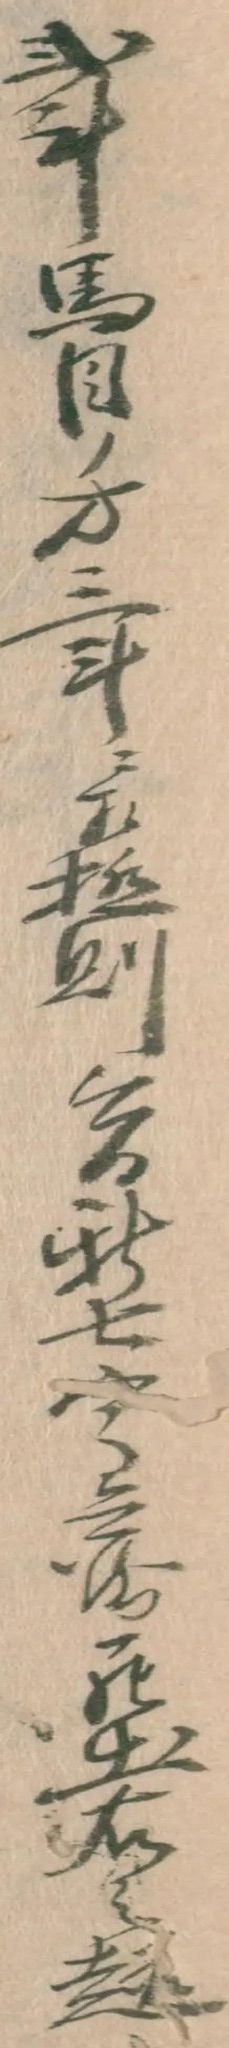弐斗馬目ノ方三斗ニ相極則今日新七宇兵衛罷出右之趣

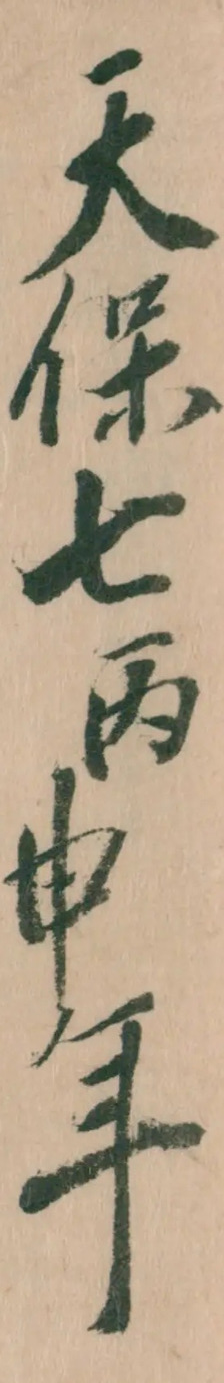天保七丙申年
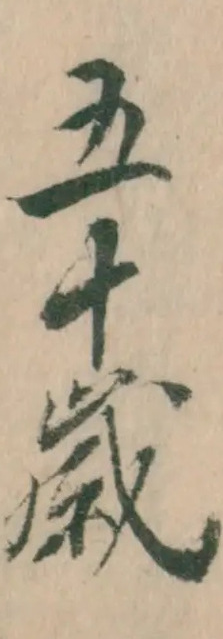五十歳

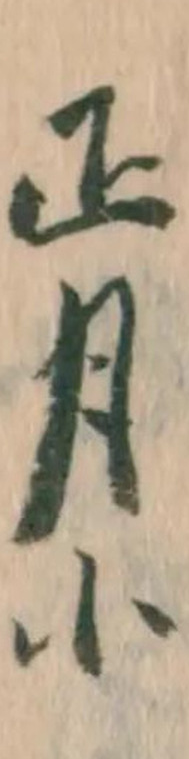正月小
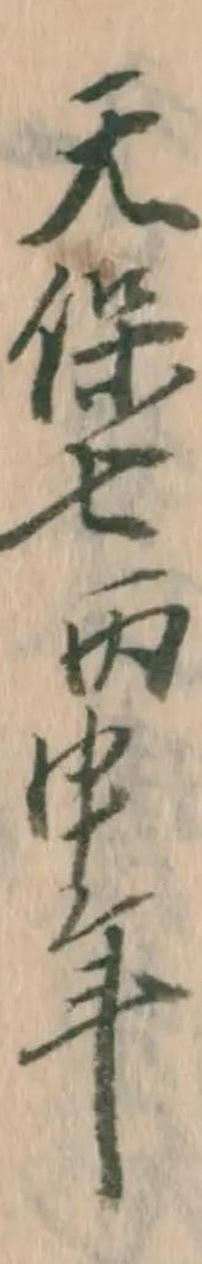天保七丙申年
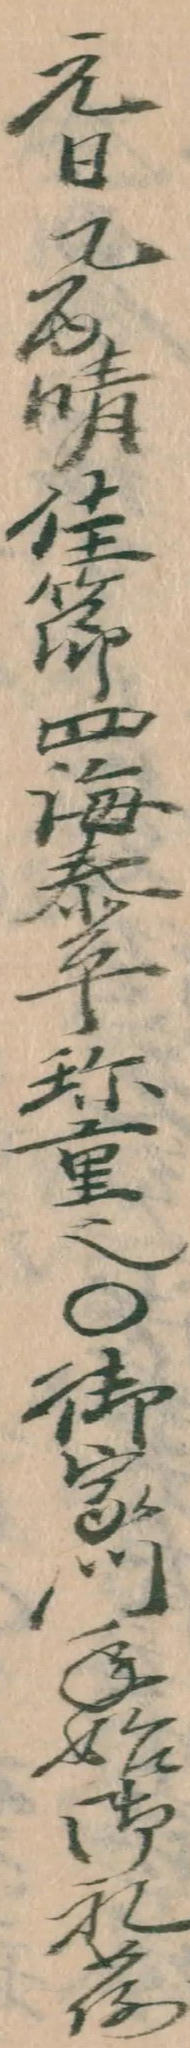元日乙酉晴佳節四海泰平称重也○御家門年始御礼如例
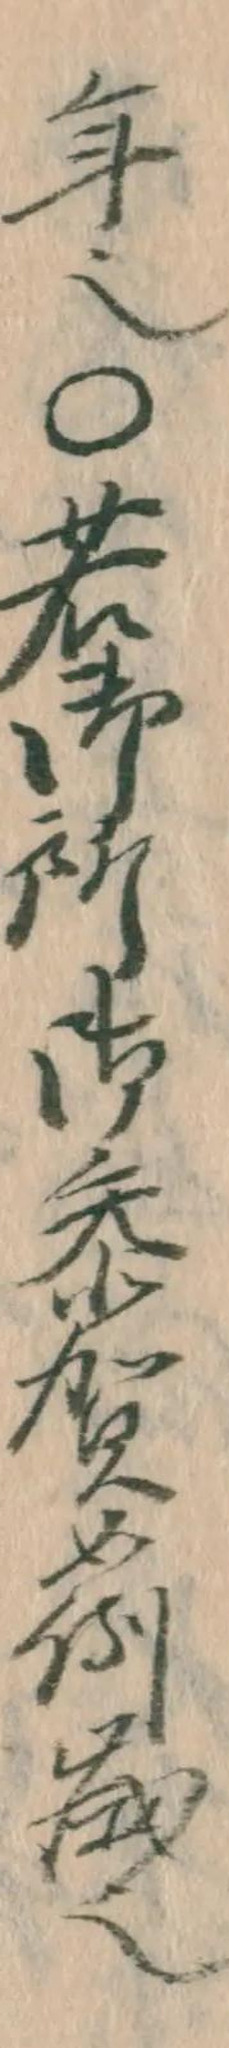年也○若御所御参賀如例歳也
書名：賀茂社記録. 第67冊
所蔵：国立国会図書館 National Diet Library, JAPAN
